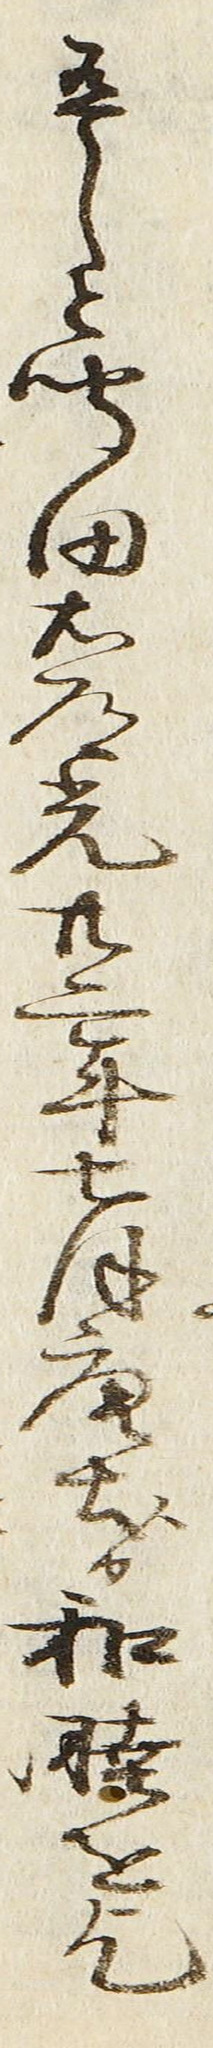有しと聞ゆ右道光廿二年七月唐土ゟ和睦を乞
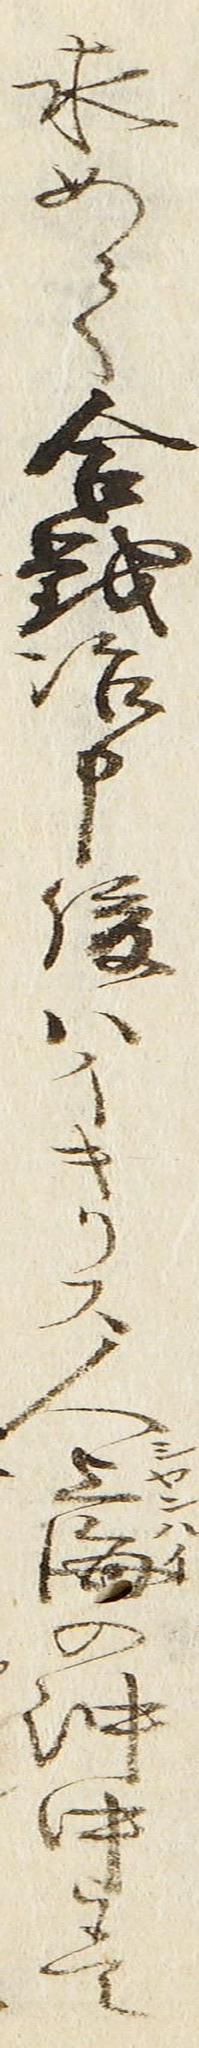求めて合戦治申後ハイキリス人上海の沖中にて
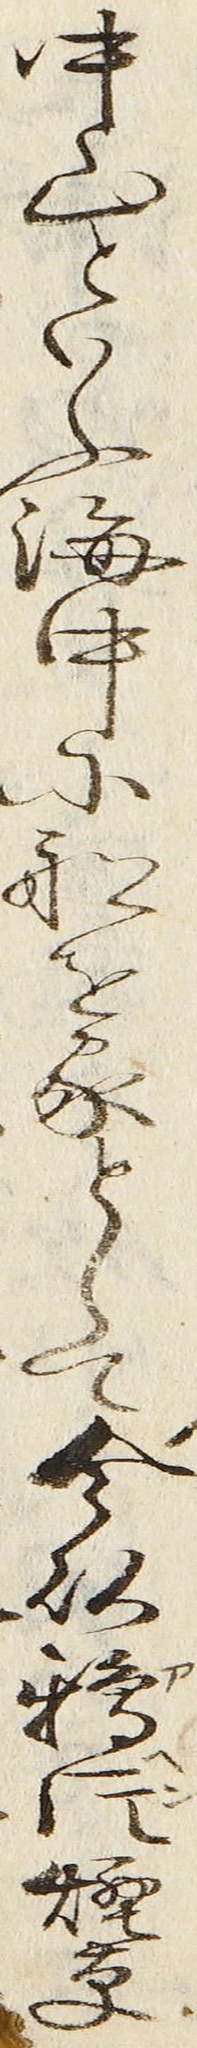中山といふ海中に船を家として今以鴉片煙草
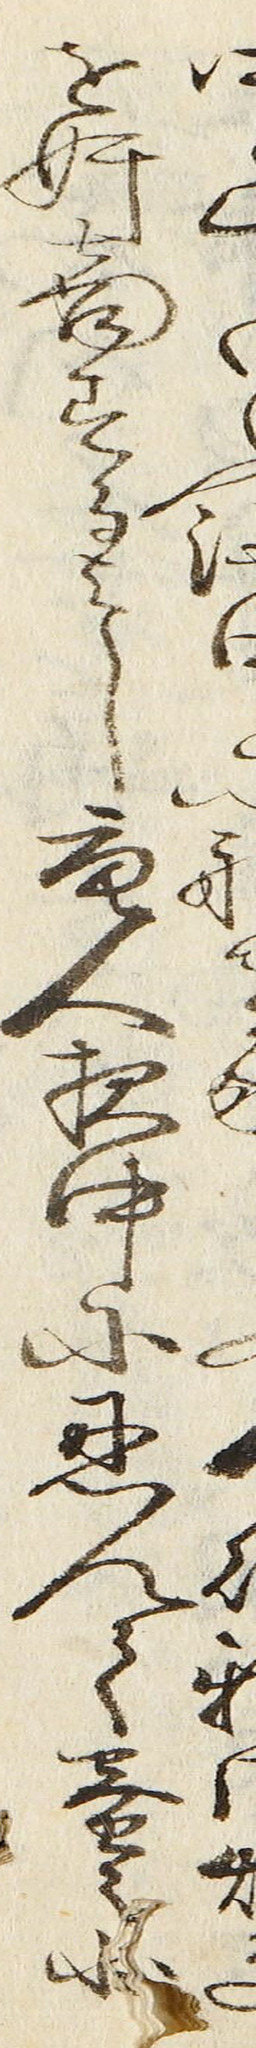を奸商するよし唐人夜中に忍んて蛋之小
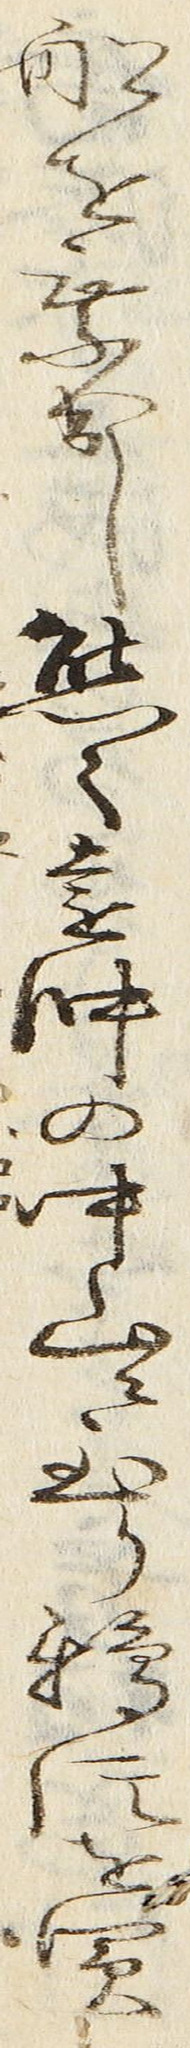船を乗出し態々遠沖の中山ニ至り鴉片を買
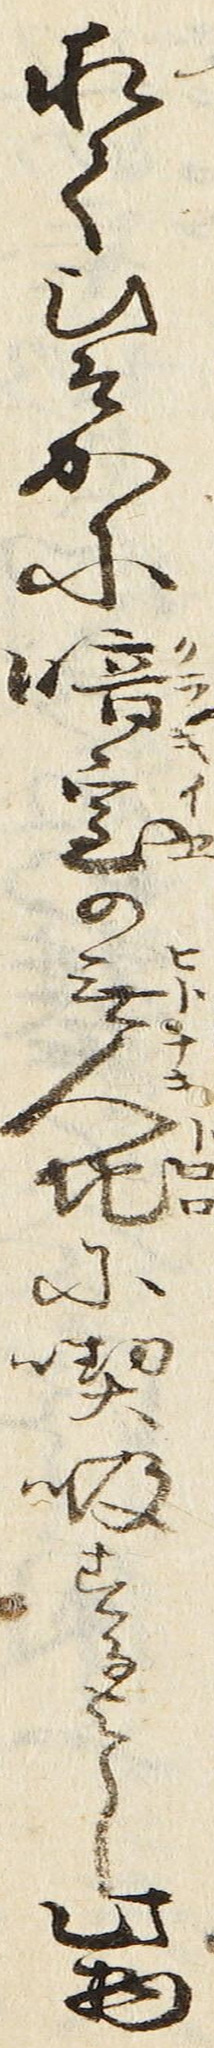求てひそかに暗室の無人地に喫吸するよし此物
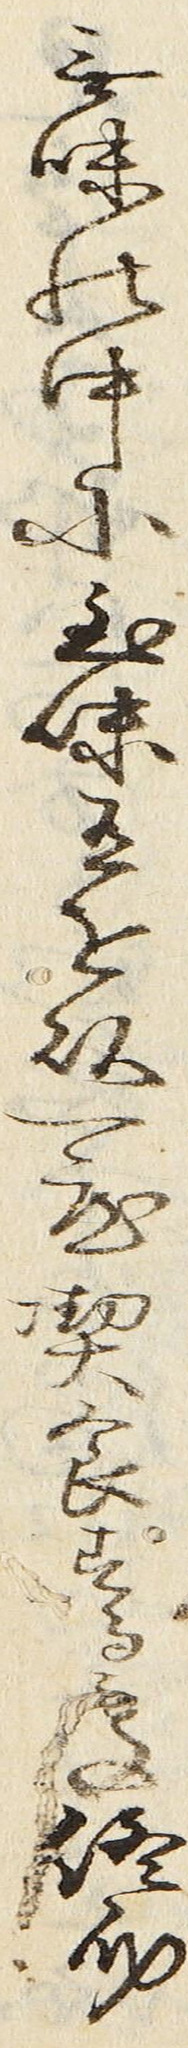無味の中に至味有を以一度喫食するもの終身
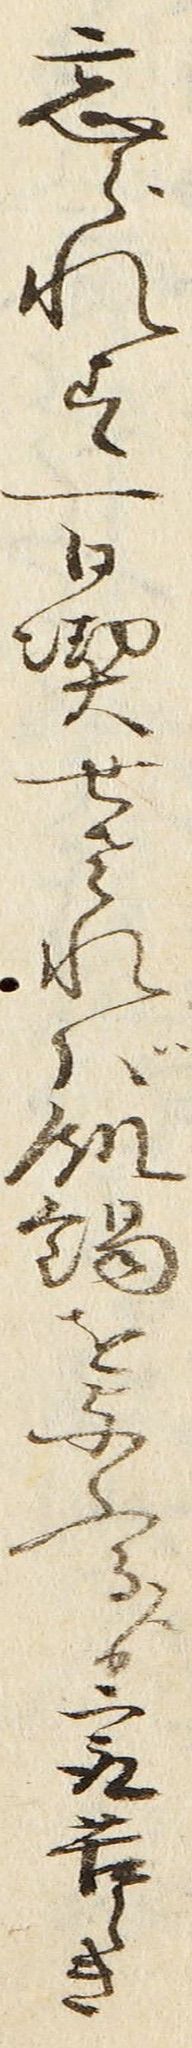忘られす一日喫せされバ飢餲を与ふるゟ最苦しき
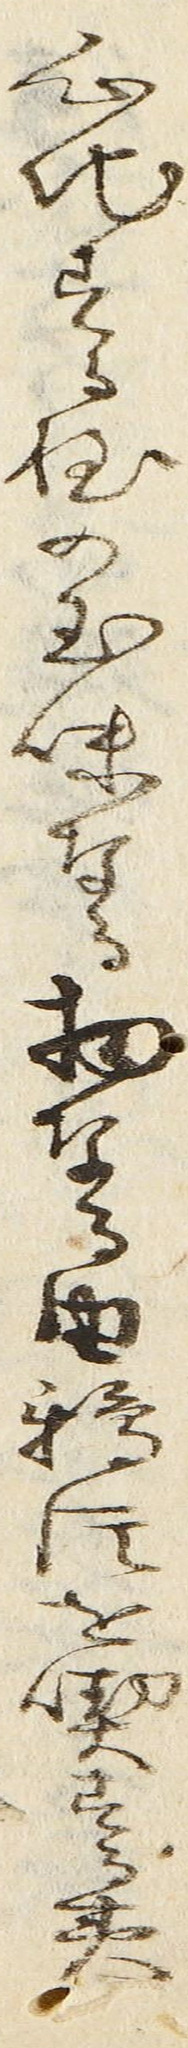心地する程の至味なる物なる由鴉片を喫する夷
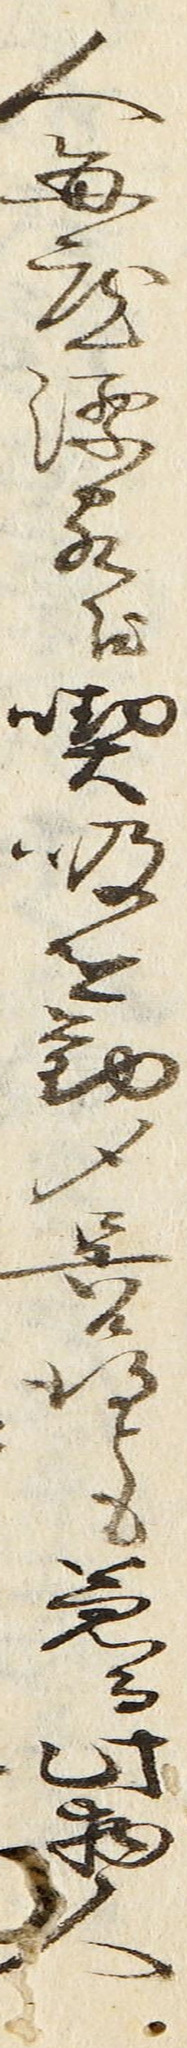人毎度漂客え喫吸を勧メ呉候得とも兼而此物人
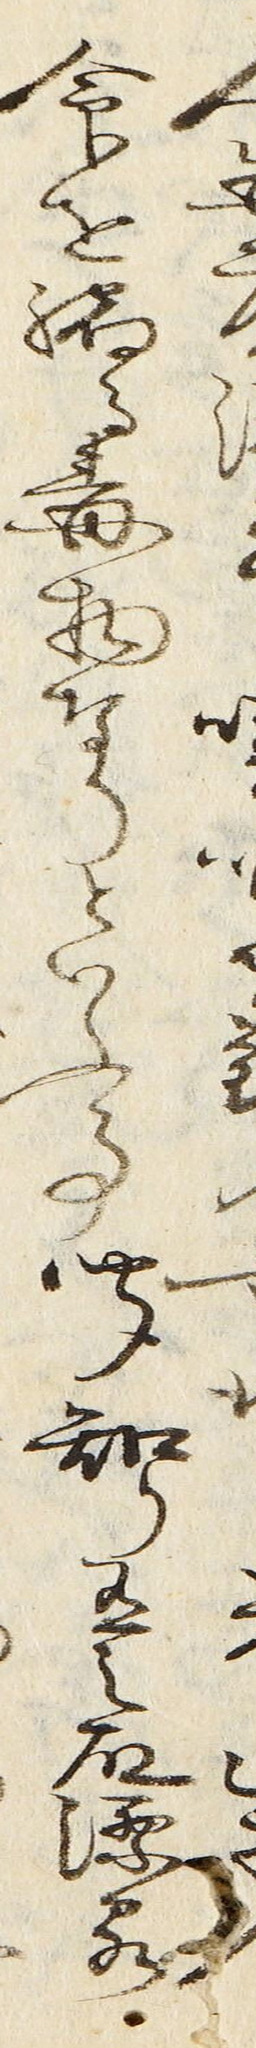命を縮る毒物なりといふ事聞知り有之故漂客
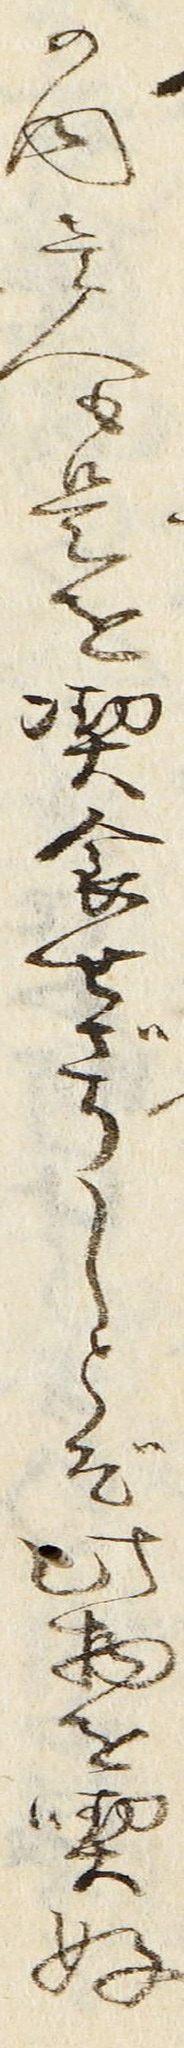の内壱人も是を喫食せざりしとぞ此物を喫好
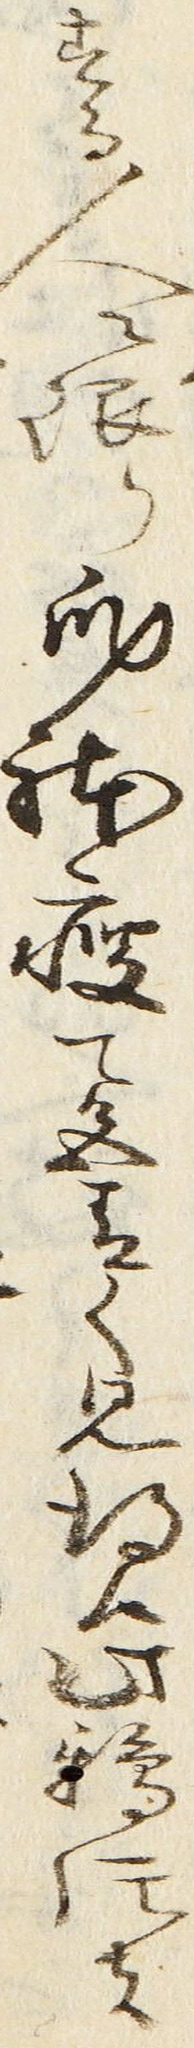する人ニ限り身体痩て色青く見得候此鴉片は
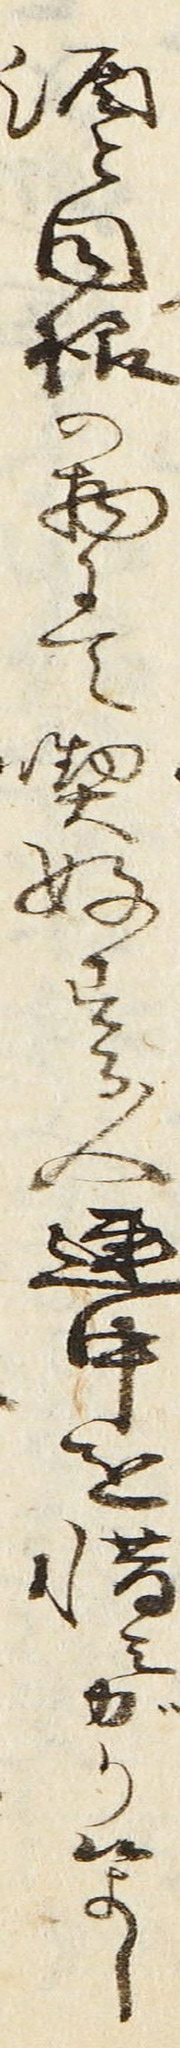酒と同様の物にて喫好する人連中を惜ミガリ候よし
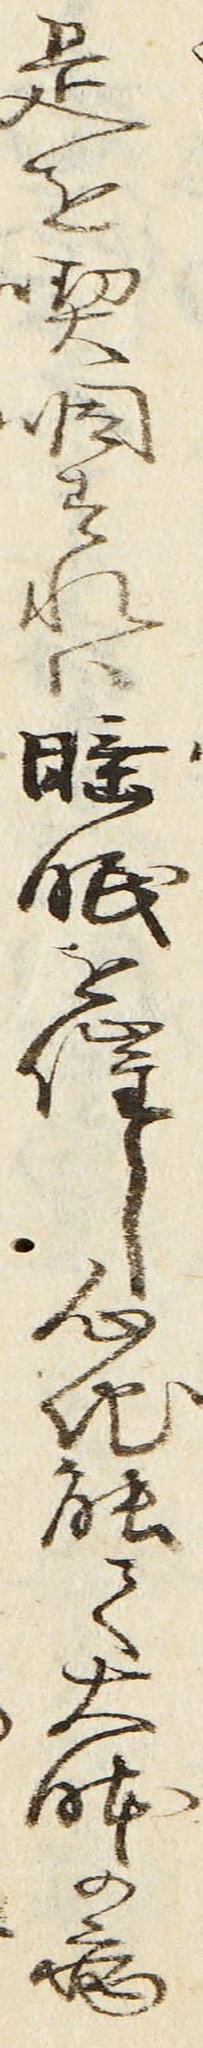是を喫咽すれハ睡眠を催し心地能て大体の病
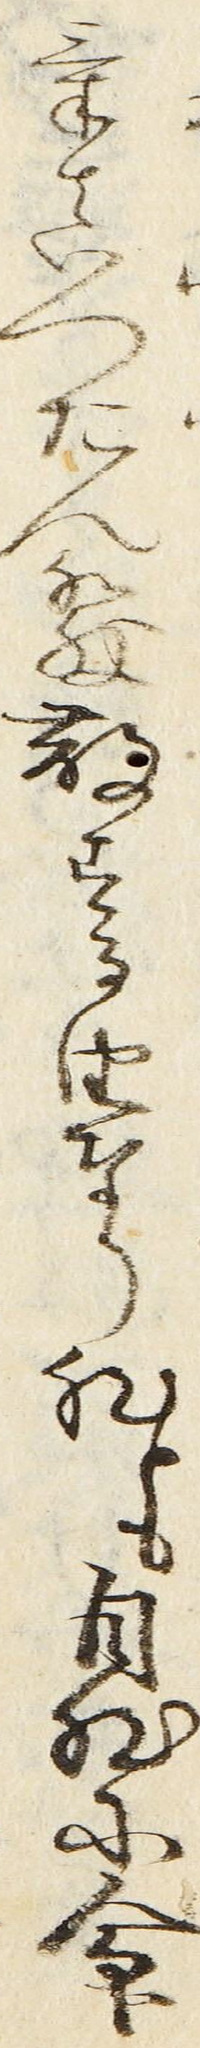気はいつたん発散する由なり然とも自然に命
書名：亜墨利加漂流記聞
